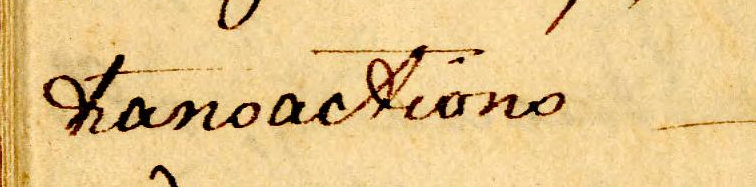transactions
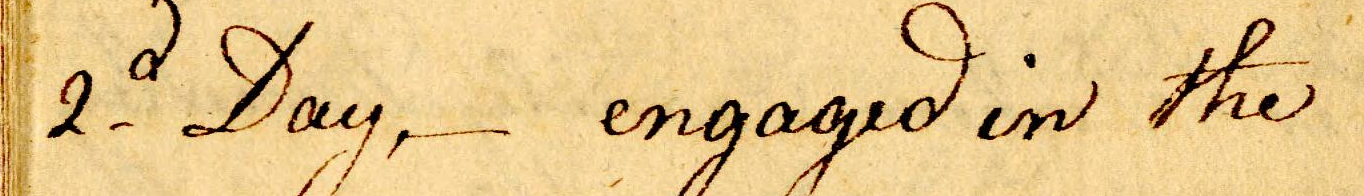2^d. Day- engaged in the
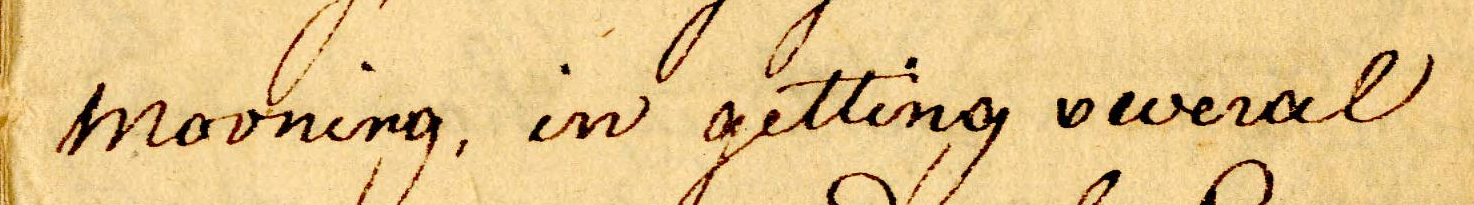Morning, in getting several
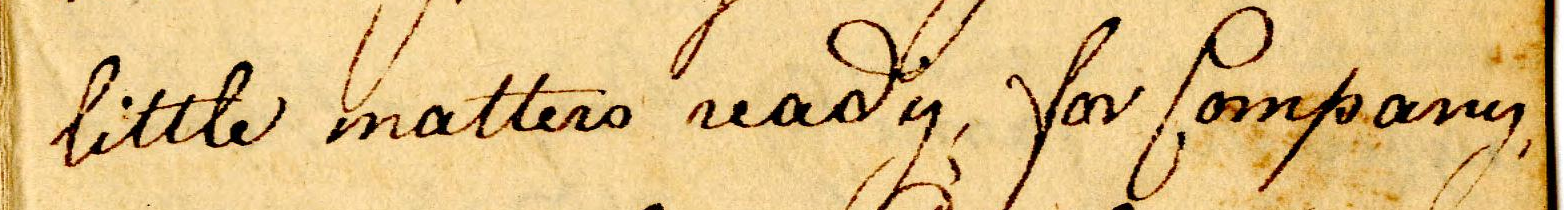little matters ready, for Company,
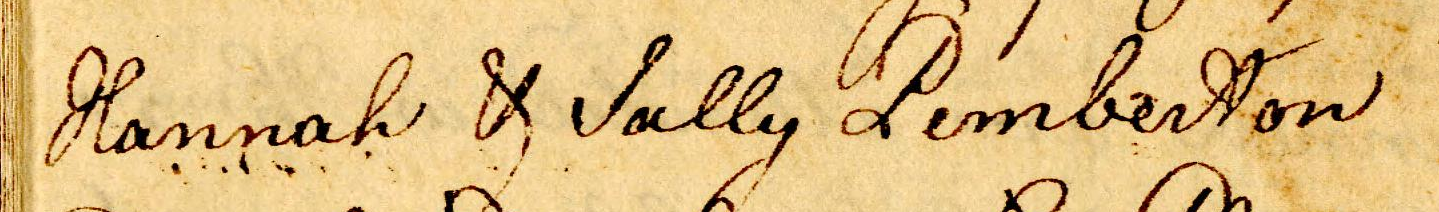Hannah & Sally Pemberton
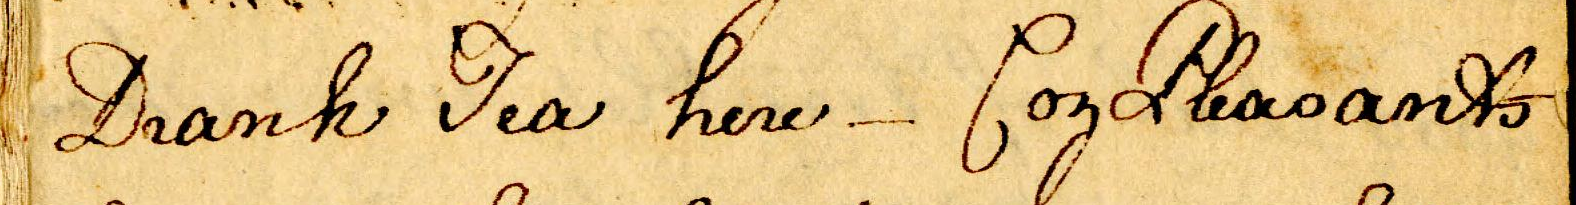Drank Tea here- Coz Pleasants
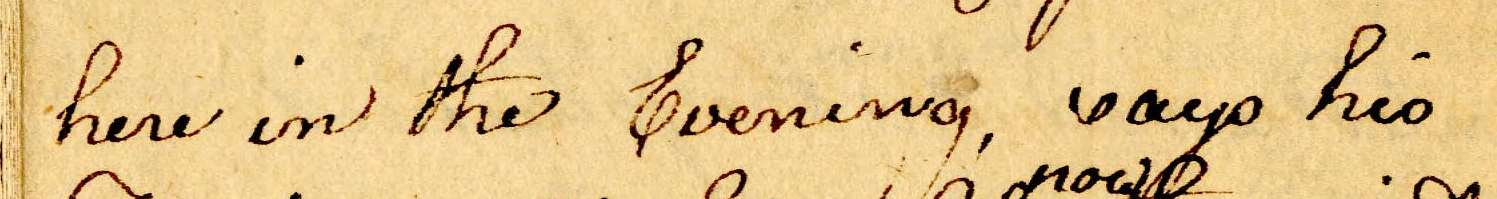here in the Evening, says his
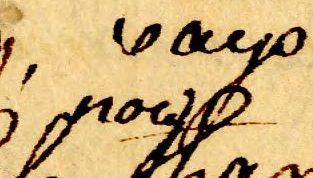now
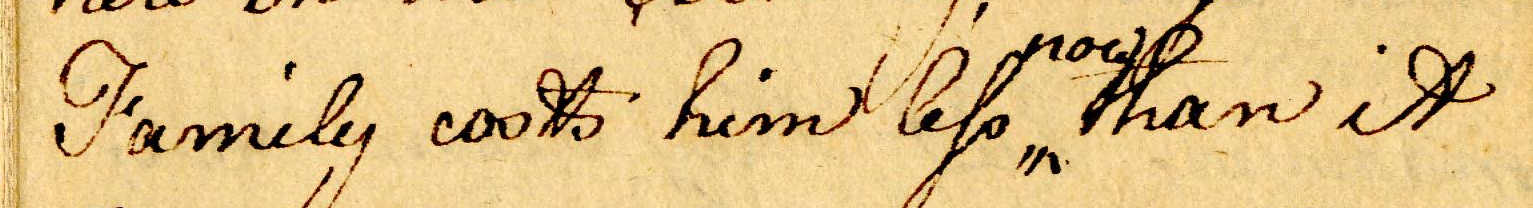Family costs him less ^ than it
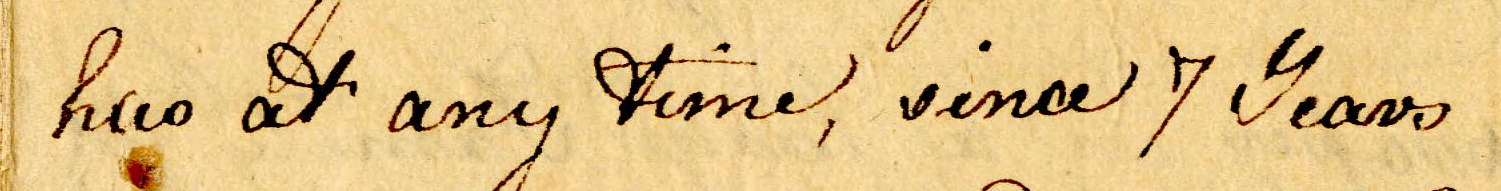has at any time, since 7 Years
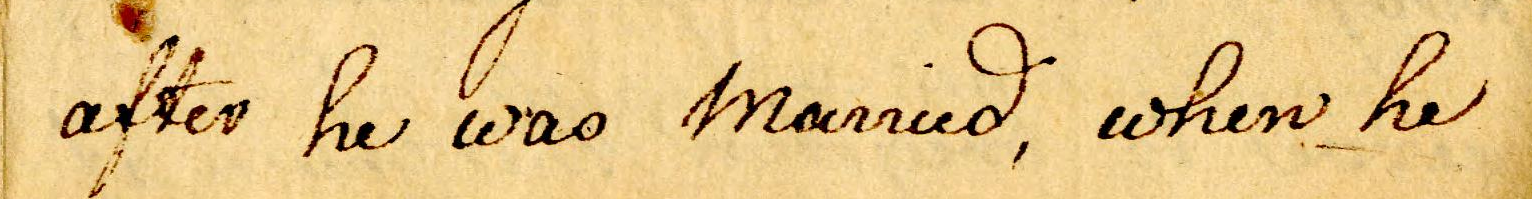after he was Married, when he
